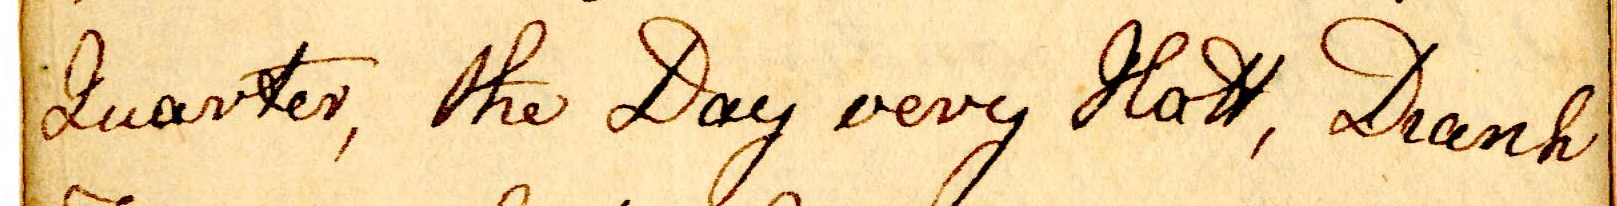Quarter, the Day very Hott, Drank
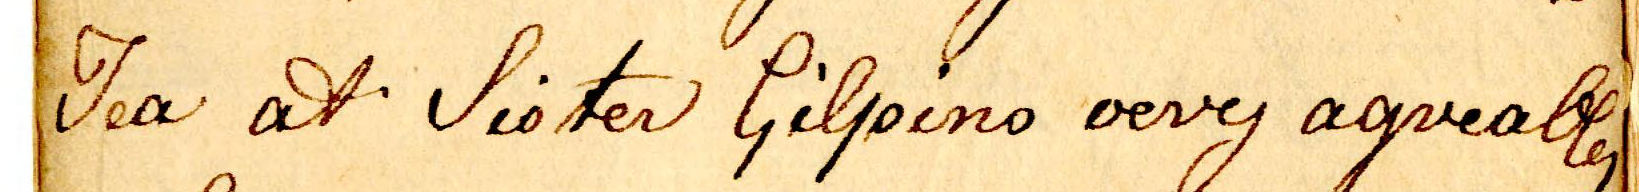Tea at Sister Gilpins very agreably
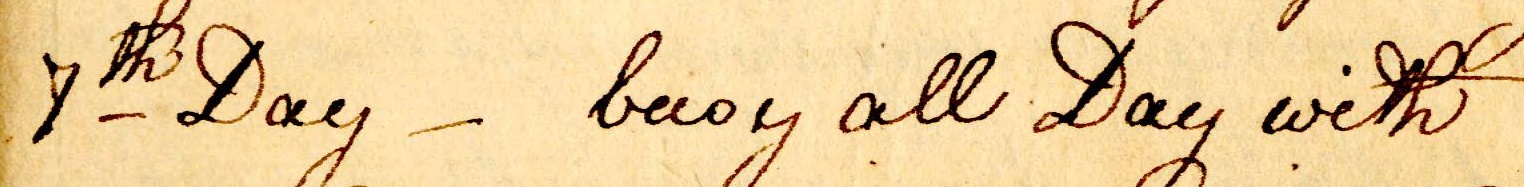7^th Day- busy all Day with
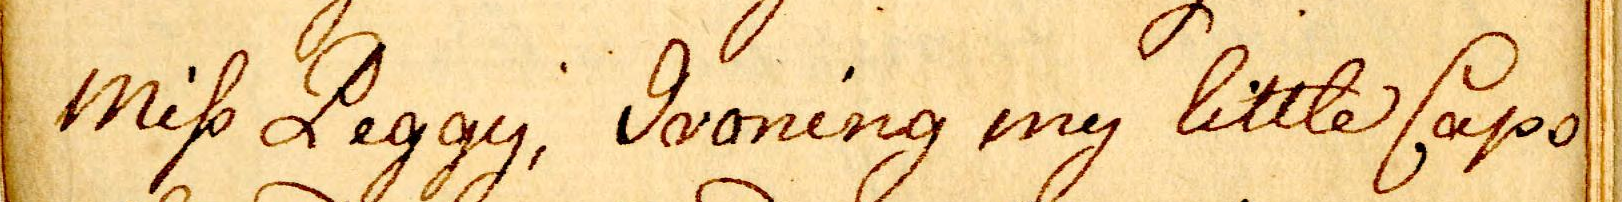Miss Peggy, Ironing my little Caps
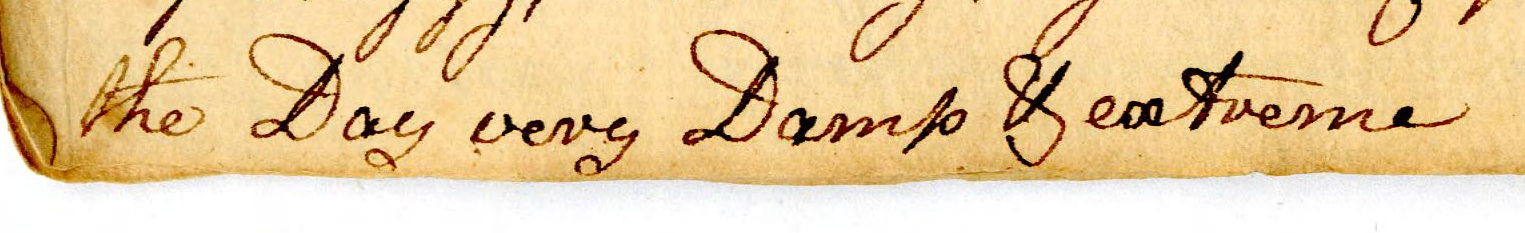the Day very Damp & extreme
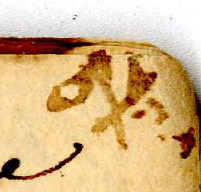57
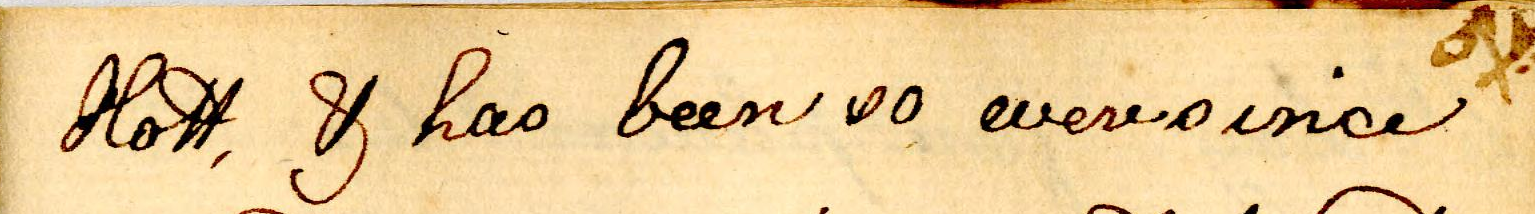Hott & has been so evere since
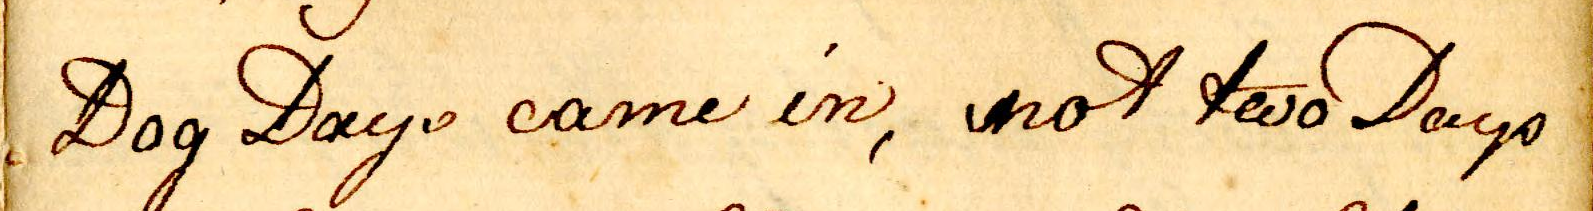Dog Days came in, not two Days
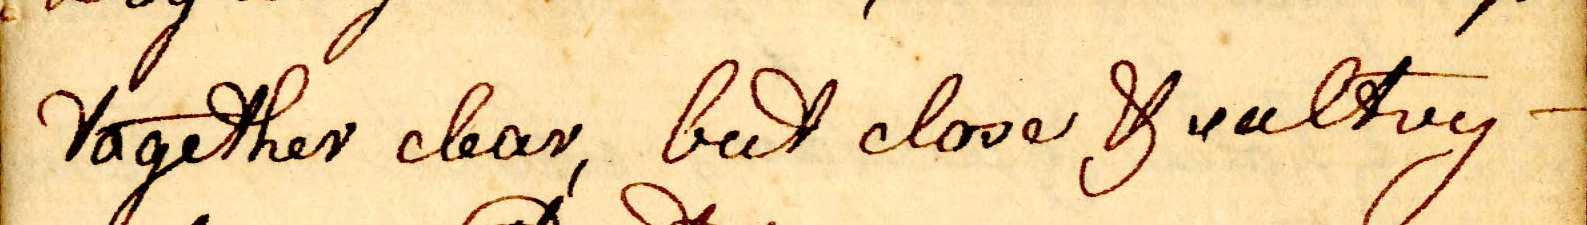together clear, but close & sultry-
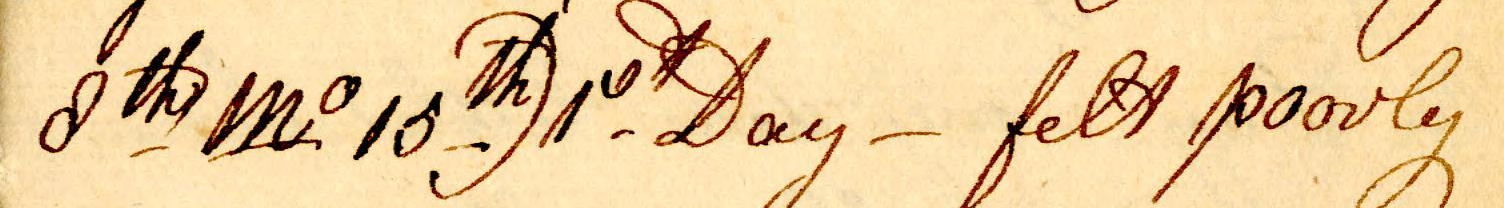8^th M^0 15^th) 1^st Day- felt poorly
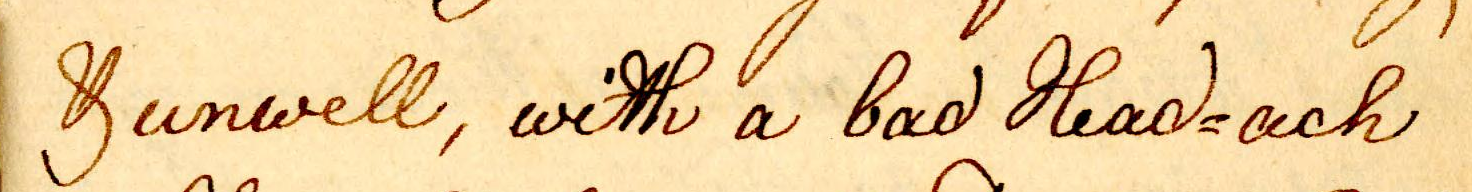& unwell, with a bad Head-ach
